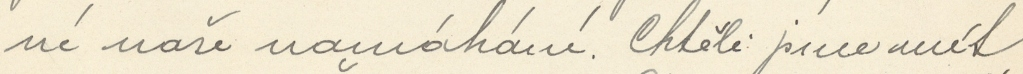né naše namáhání. Chtěli jsme mít
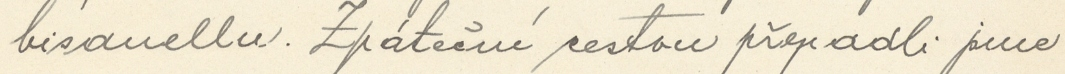bisanellu. Zpáteční cestou přepadli jsme
